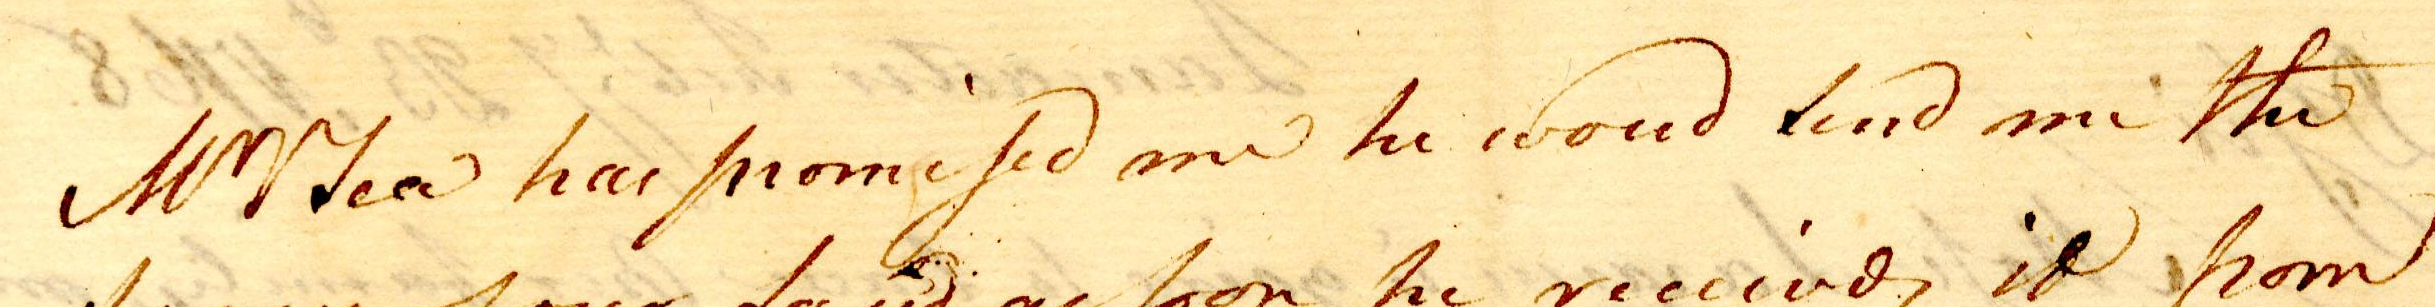M^r Tee has promised me he woud lend me the
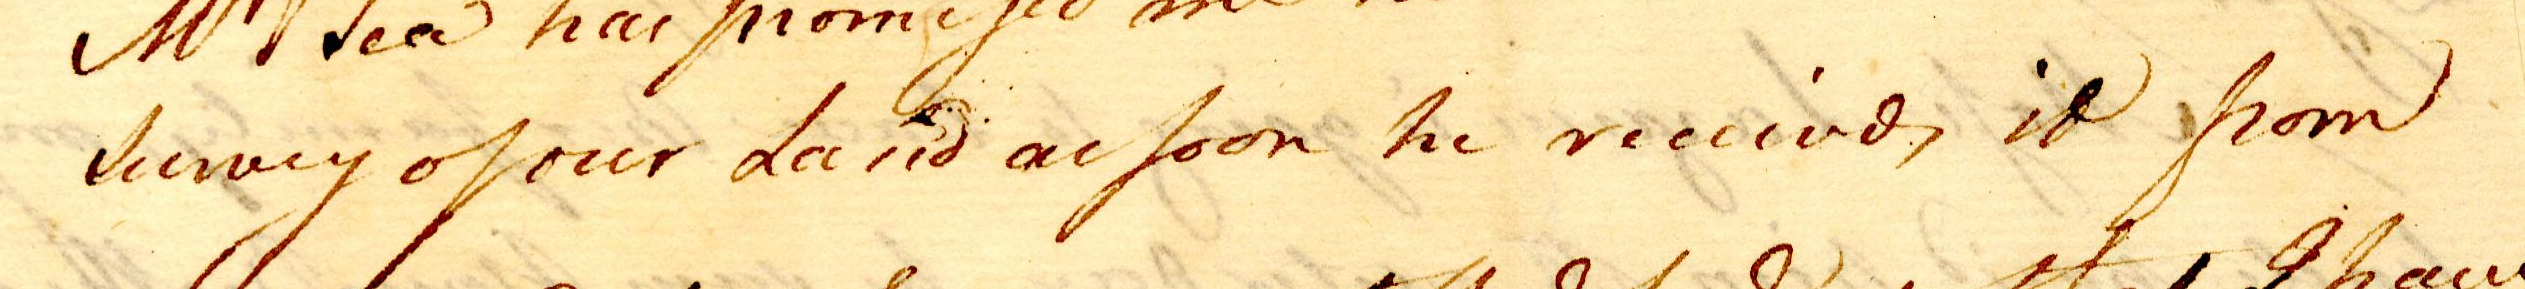survey of our Land as soon he received it from
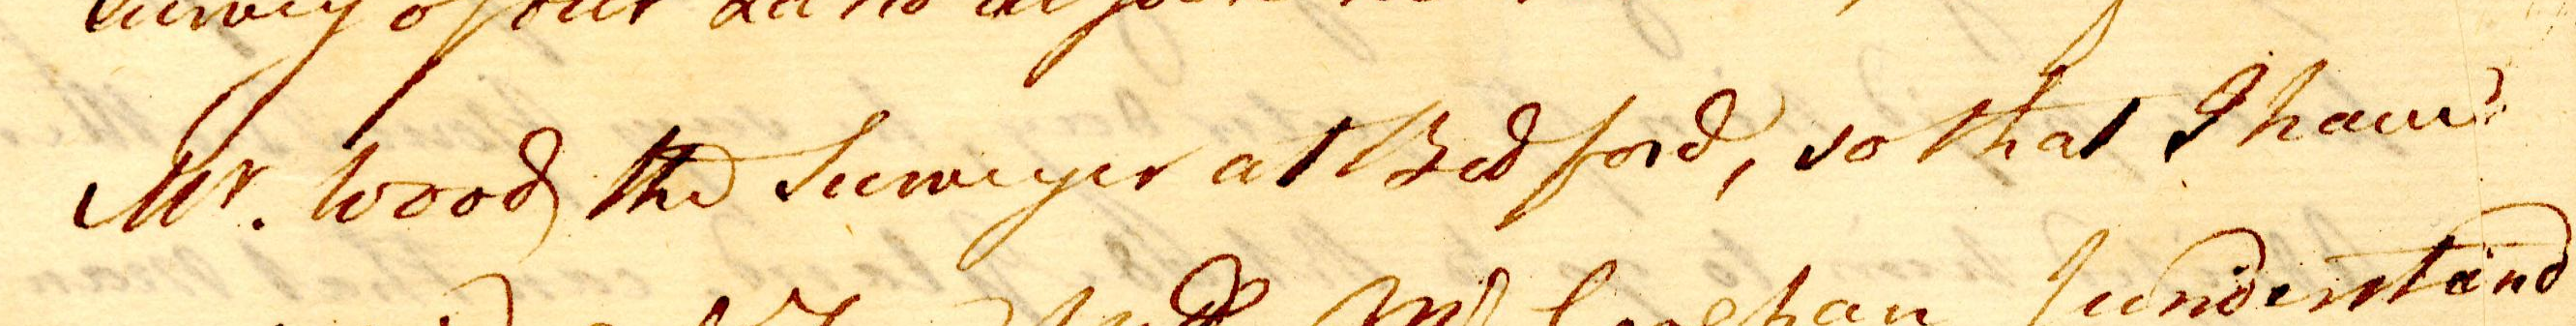M^r. Wood the Surveyer at Bedford, so that I have
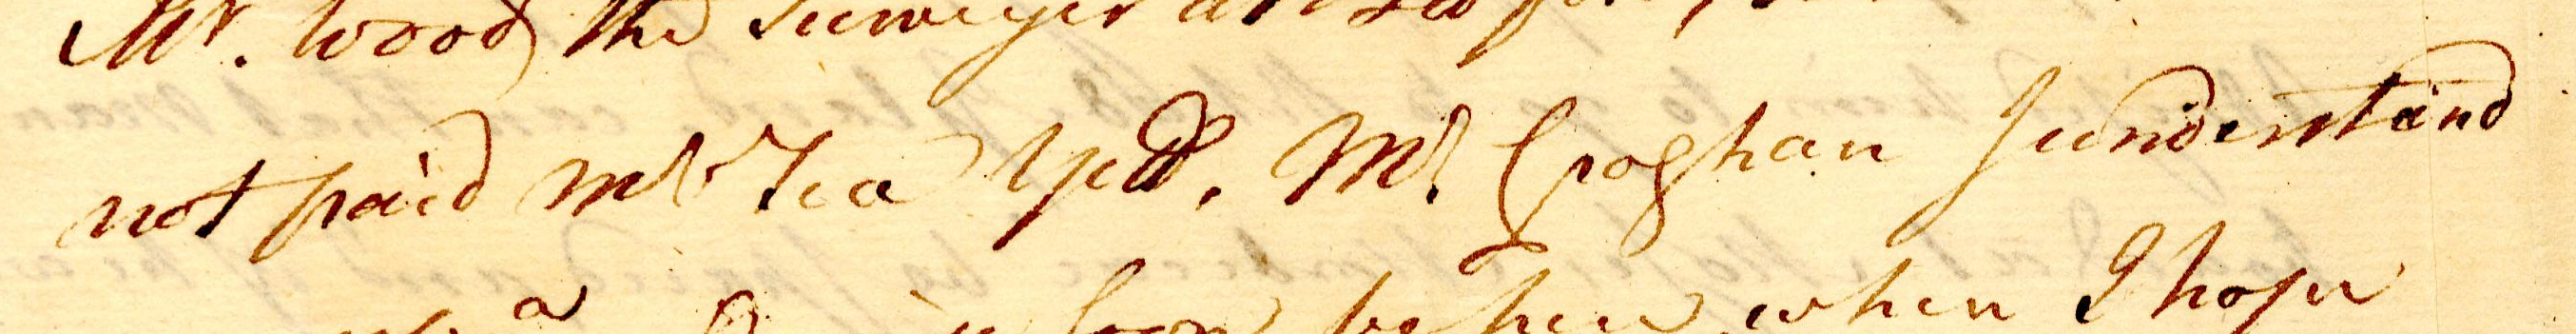not paid M^r Tee yed, M^r.Croghan I understand
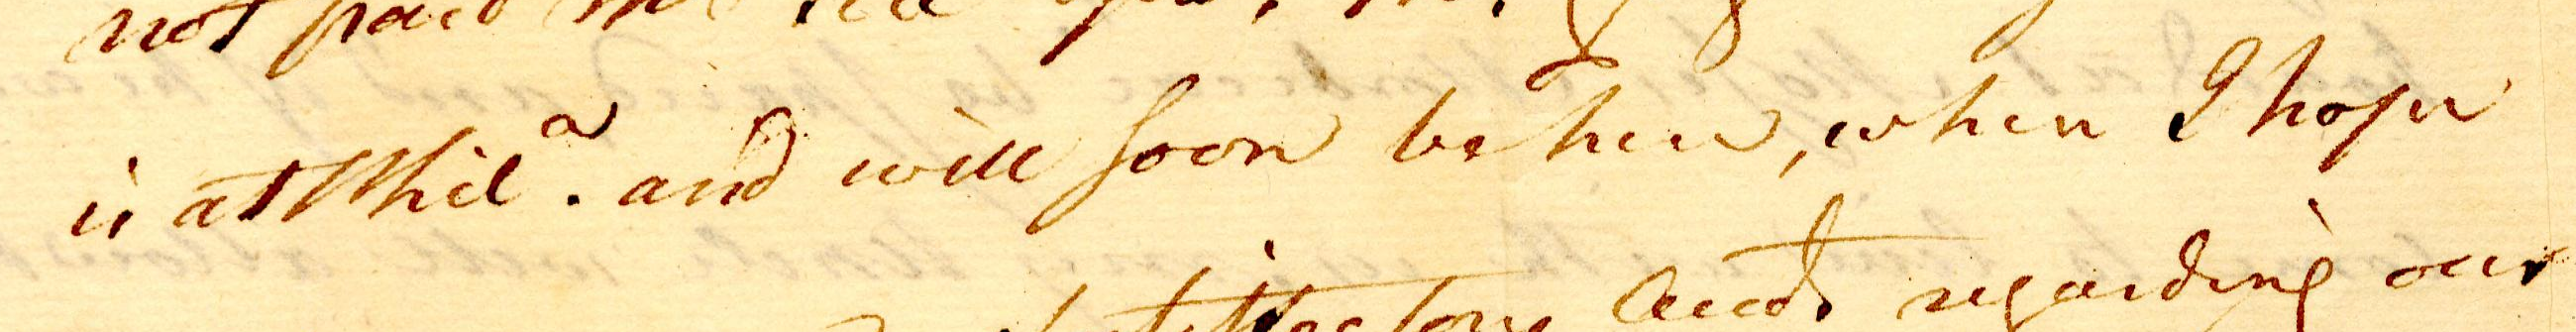is at Phil^a. and will soon be here, when I hope
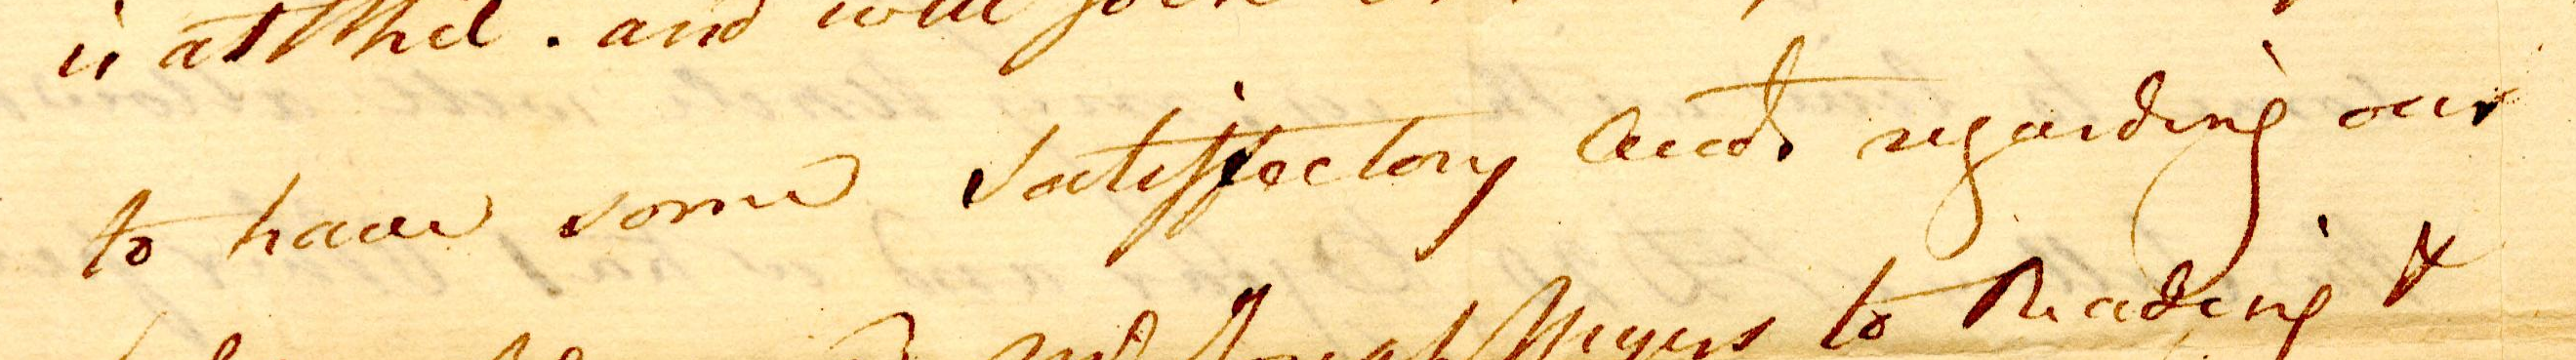to have some Satisfactory acct regarding our
